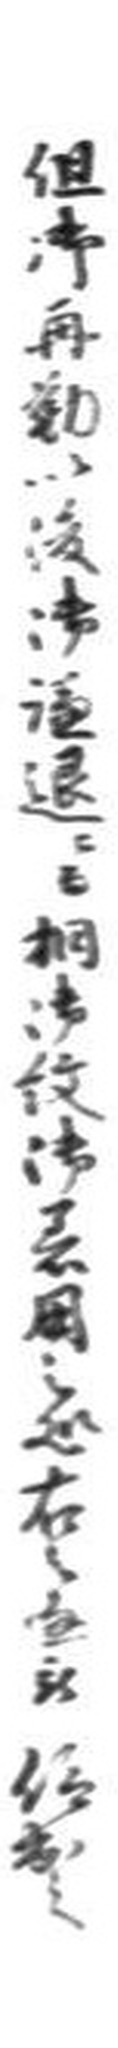但御再勤以後御謙退ニ而桐御紋御着用之処右之通被仰出之
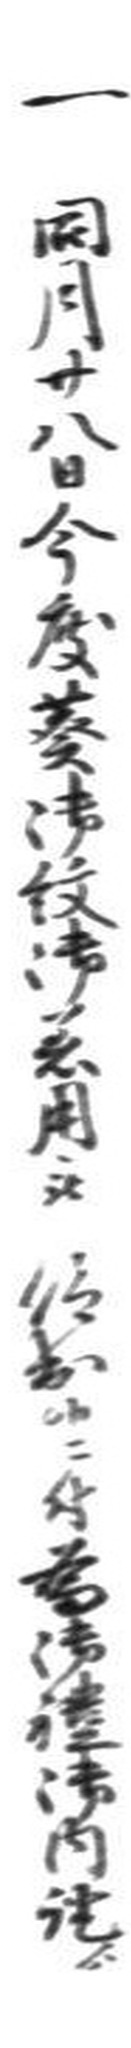一同月廿八日今度葵御紋御着用被仰出候ニ付為御礼御内証ゟ
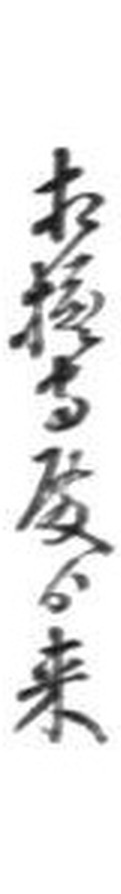相模守殿ゟ来

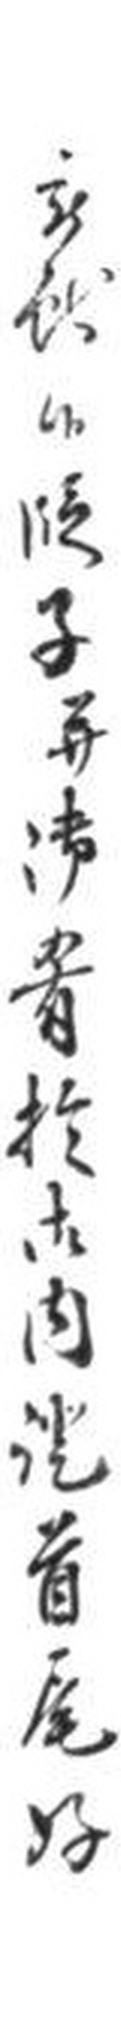被献候段子并御肴於御内証首尾好
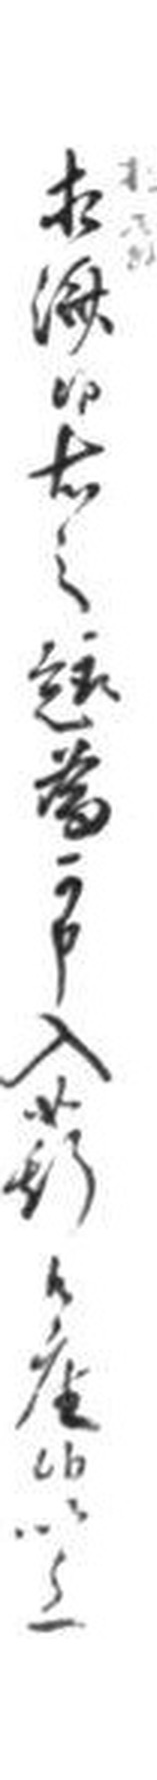披露相済候右之趣為可申入如斯御座候以上
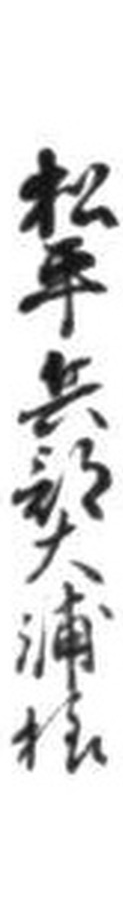松平兵部大輔様
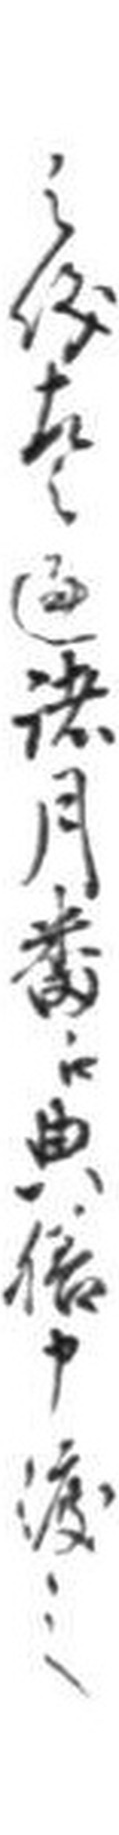之儀左之通諸月番江典膳申渡之
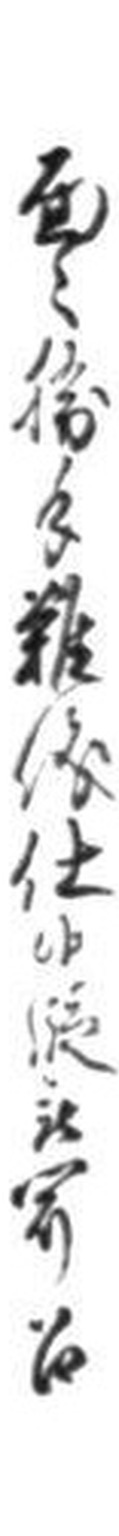面々勝手難儀仕候段被聞召
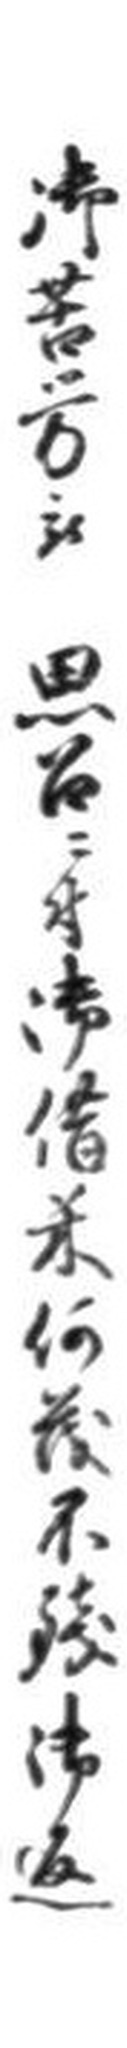御苦労被思召ニ付御借米何茂不残御返
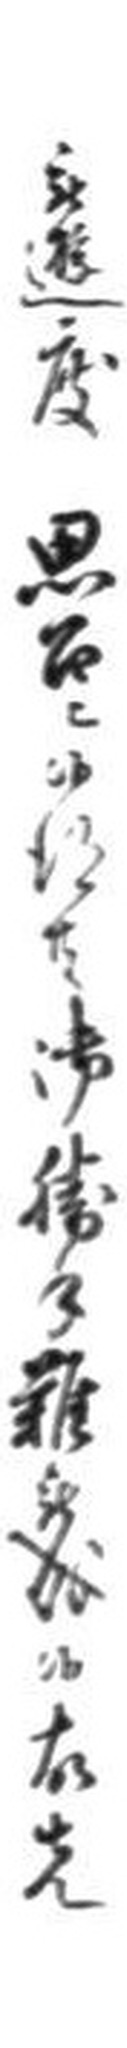被遊度思召ニ候得共御勝手難被成候故先
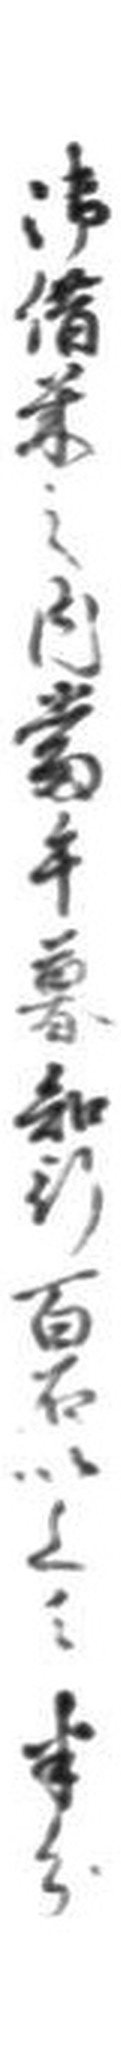御借米之内当午暮知行百石以上者半分
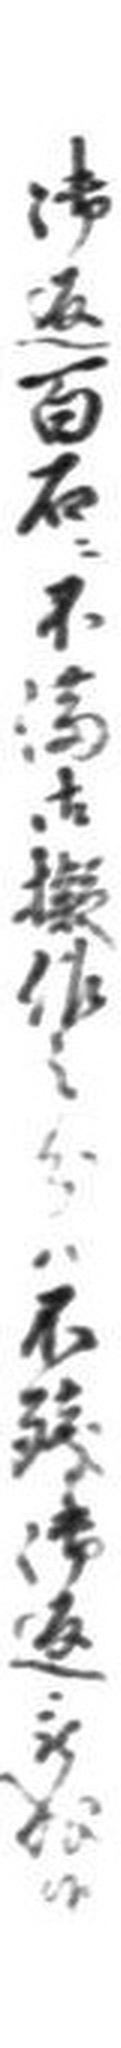御返百石ニ不満御擬作之分ハ不残御返被成候
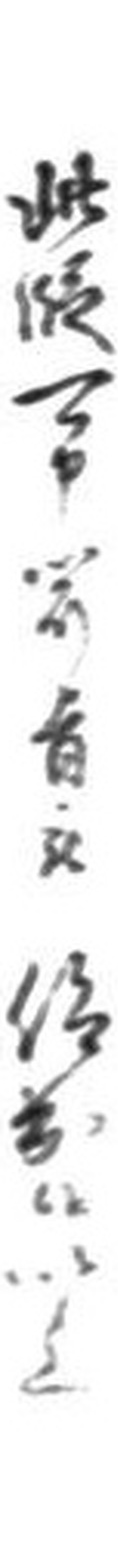此段可申聞旨被仰出候以上
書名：家譜 二十二 吉品公 従元禄十五年到同十六年
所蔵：福井県文書館 Fukui Prefectural Archives
